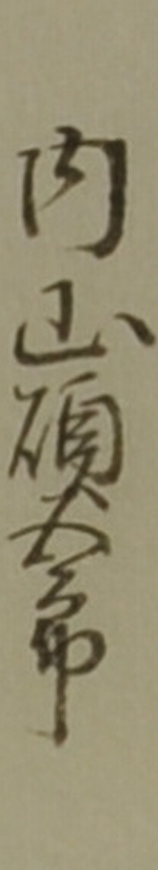内山碩五郎

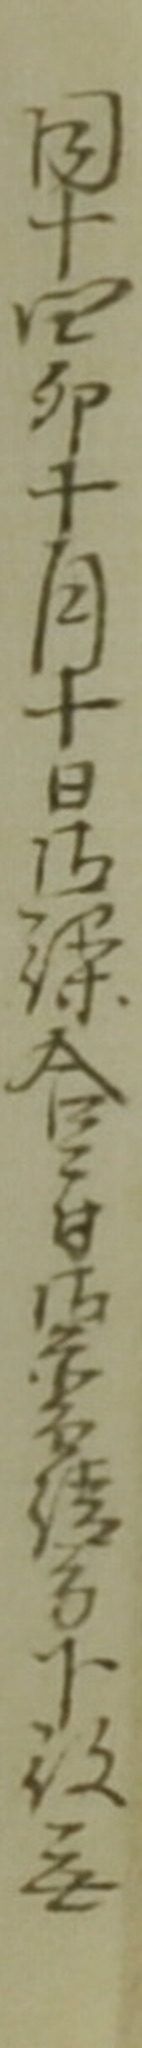一同十四卯十月十日御繰合ニ付御普請方下役無
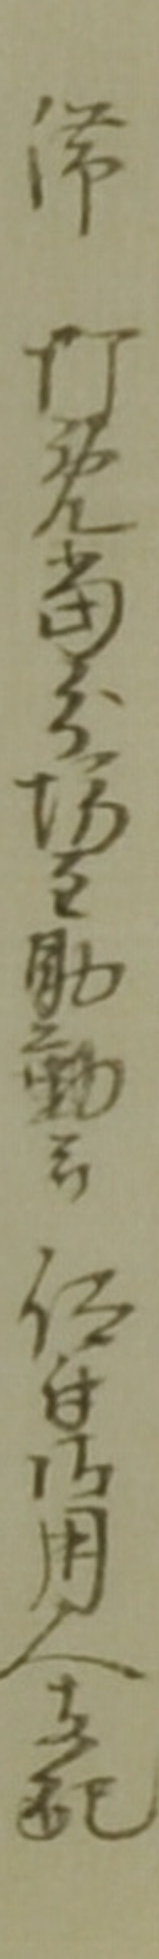滞御免当分坊主助勤被仰付御用人支配

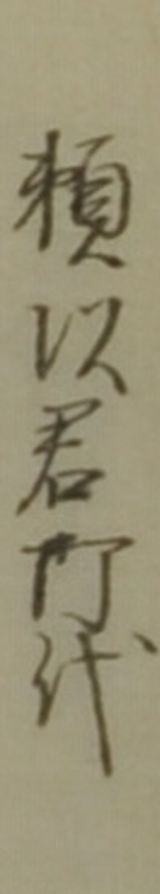頼以君御代
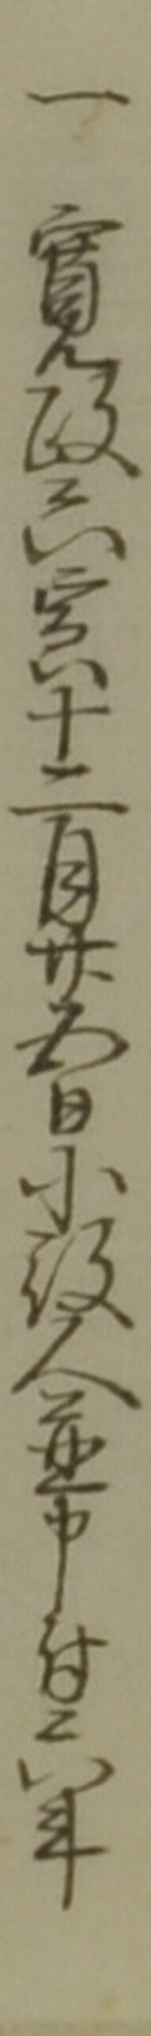一寛政六寅十二月廿五日小役人並申付六斗
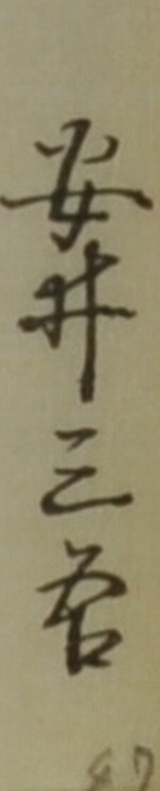安井三吾
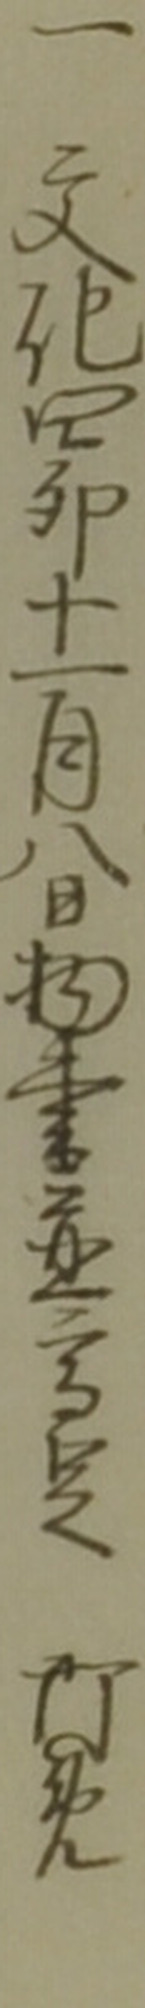一文化四卯十一月八日物書並高足御免
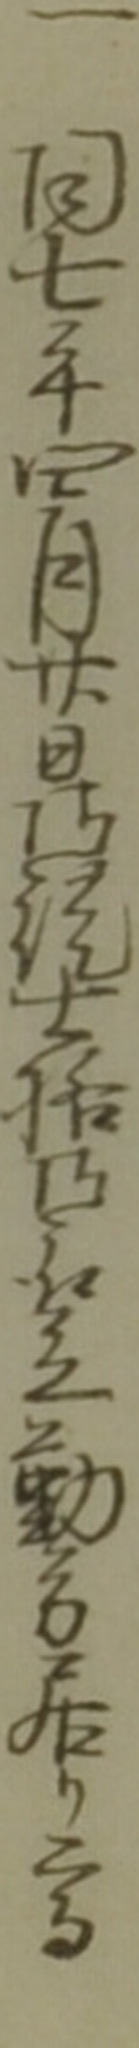一同七午四月廿日御徒士格御取立勤方居り高
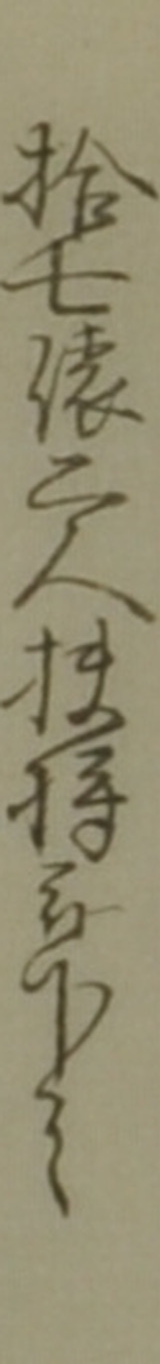拾七俵二人扶持被下之
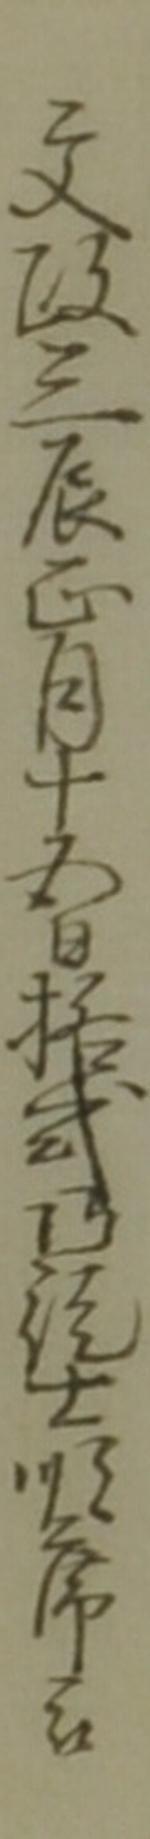一文政三辰正月十五日格式御徒士順席被
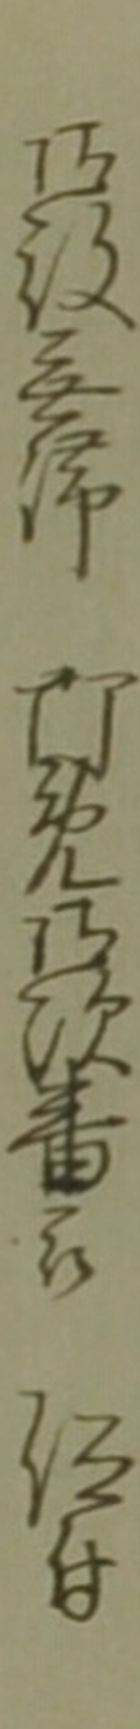御役無滞御免御次番被仰付
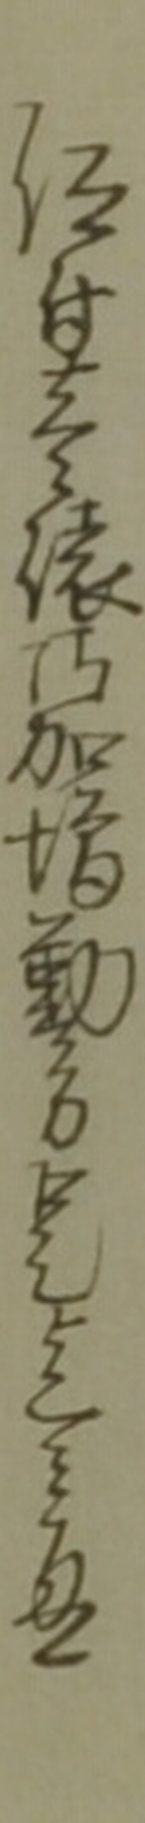仰付壱俵御加増勤方是迄之通

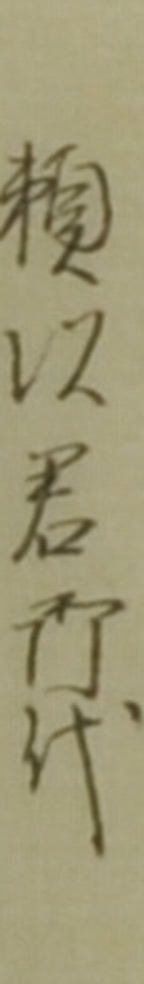頼以君御代
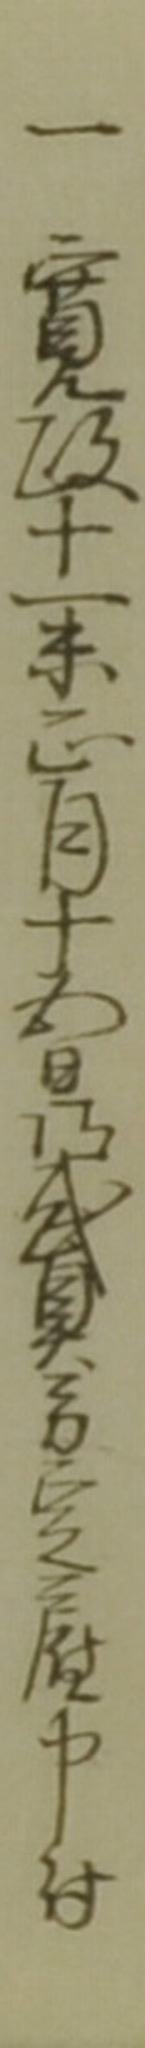一寛政十一未正月十五日御武具方定雇申付
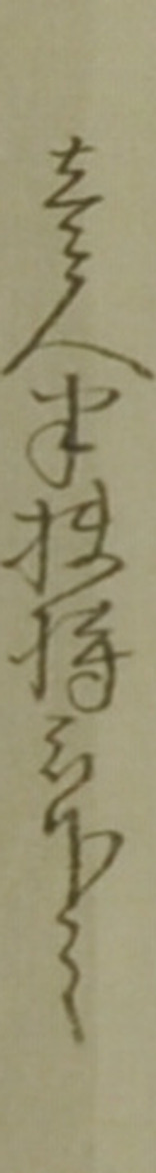壱人半扶持被下之
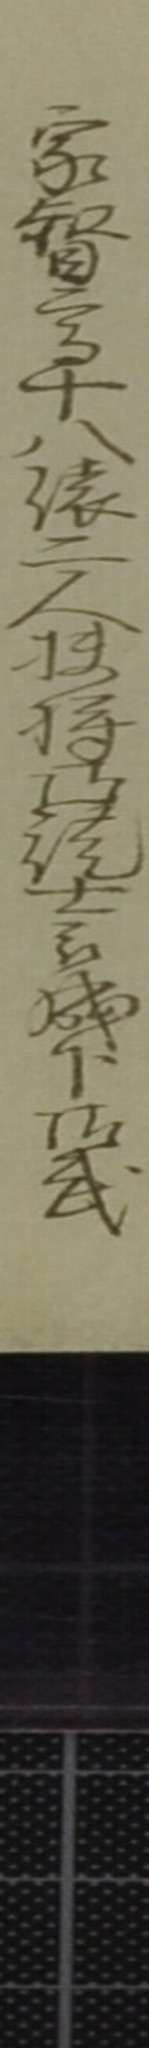家督高十八俵二人扶持御徒士被成下御武
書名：無足諸士勤仕録（六）
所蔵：伊那市立高遠町図書館・合同会社AMANE
